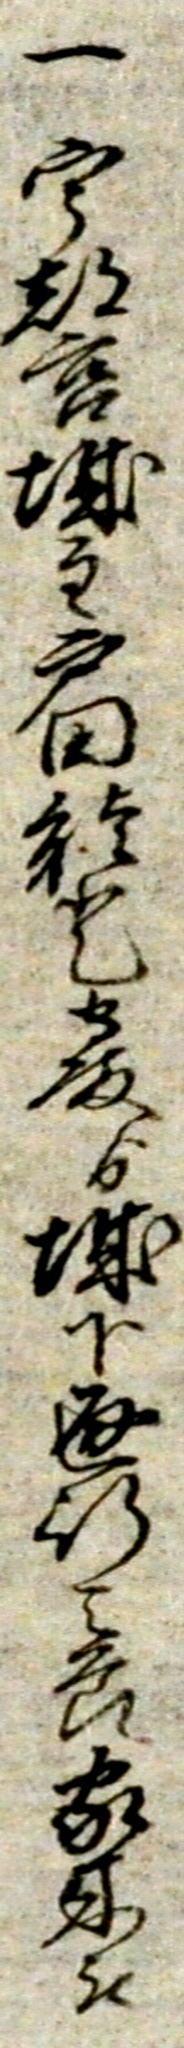一宇都宮城主戸田能登守殿ゟ城下通行之節家来被
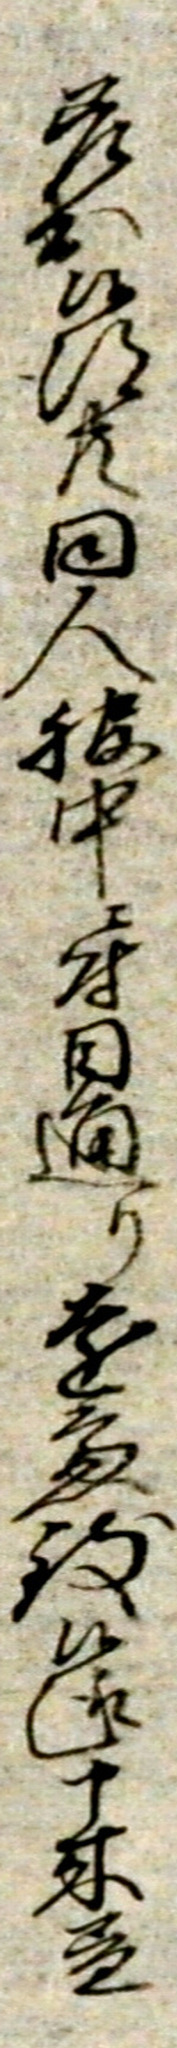差出候得共同人服中ニ付目通り遠慮致候趣申来昼
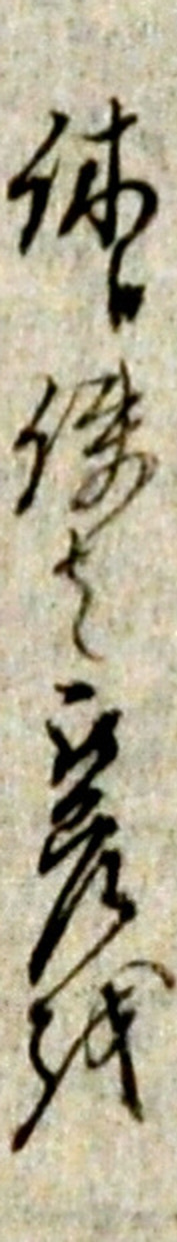休江使者被差越
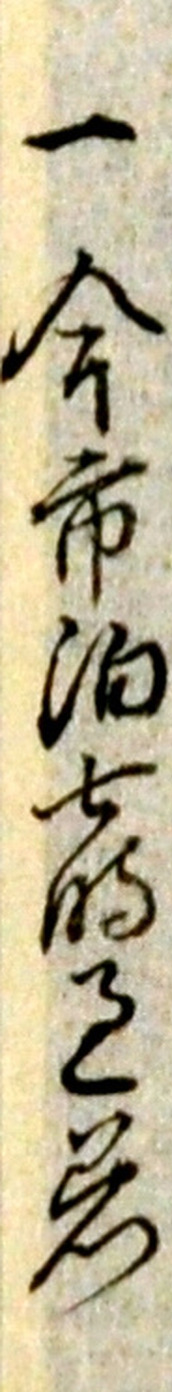一今市泊七時過着
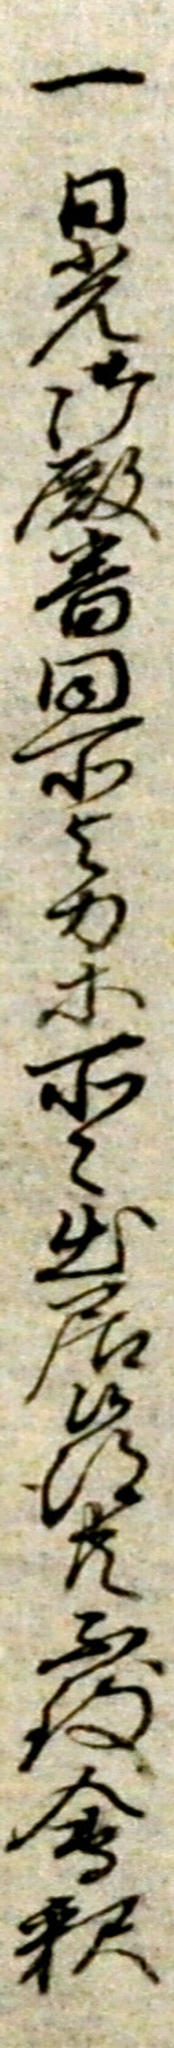一日光御殿番同所与力等所々出居候得共不致会釈
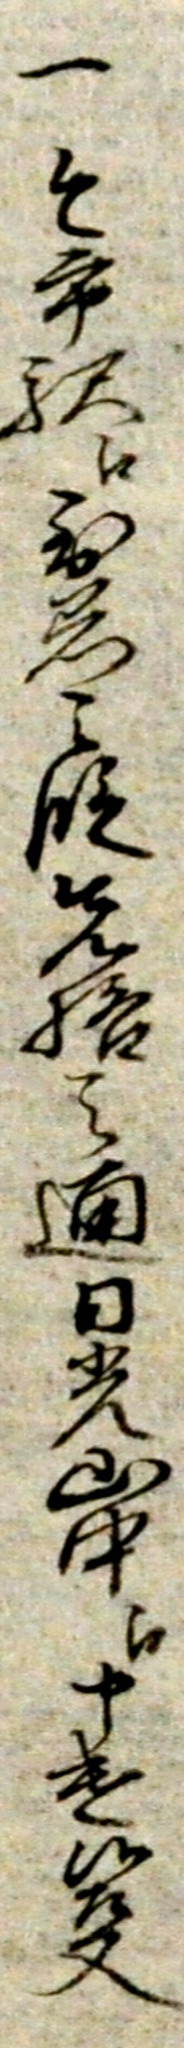一今市駅江到着之段先格之通日光山中江申遣候叓
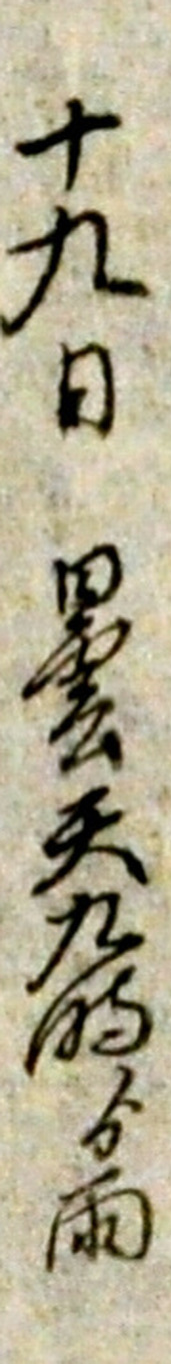十九日曇天九時ゟ雨
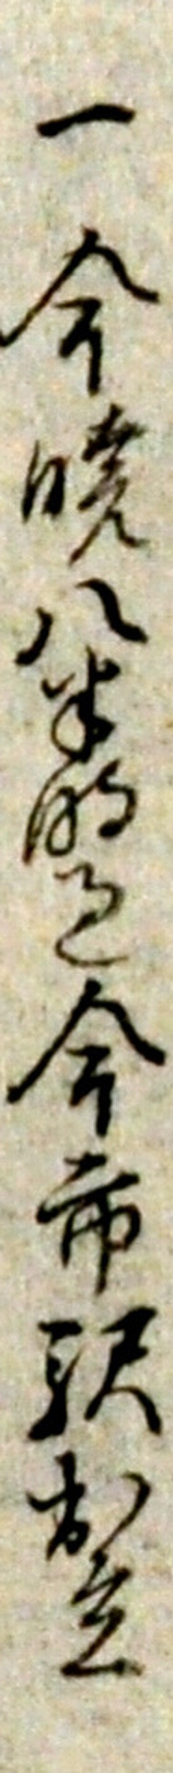一今暁八半時過今市駅出立
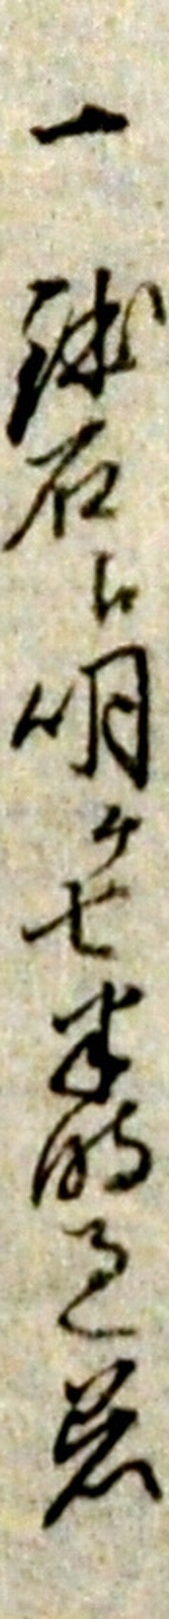一鉢石江明ヶ七半時過着
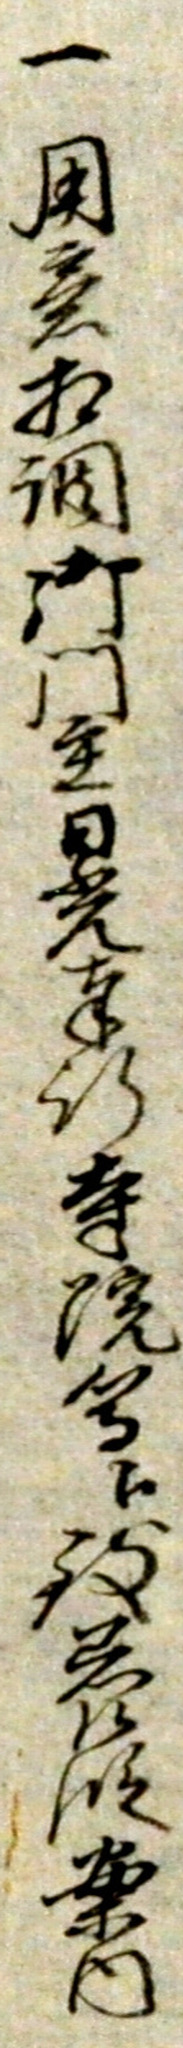一用意相調御門主日光奉行寺院等江致着候段案内
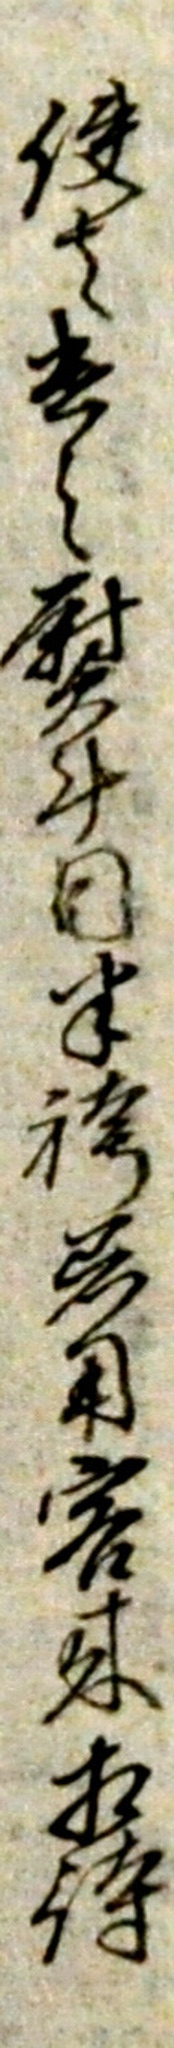使者遣之熨斗目半袴着用客来相待

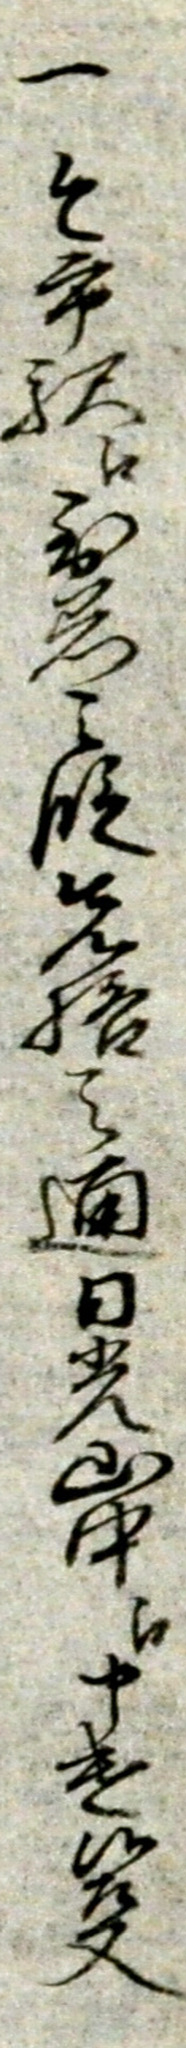一今市駅江到着之段先覚之通日光山中江申遣候叓
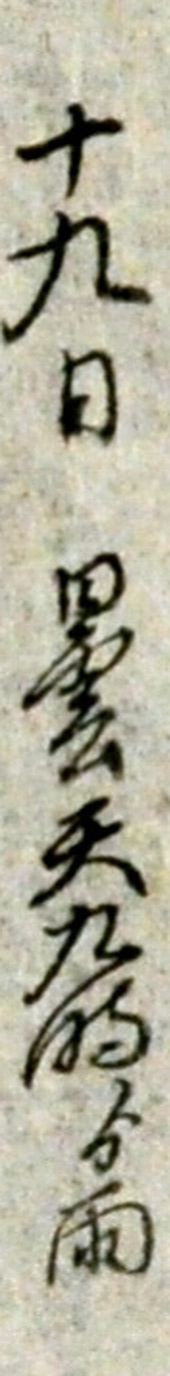十九日曇天九時ゟ雨
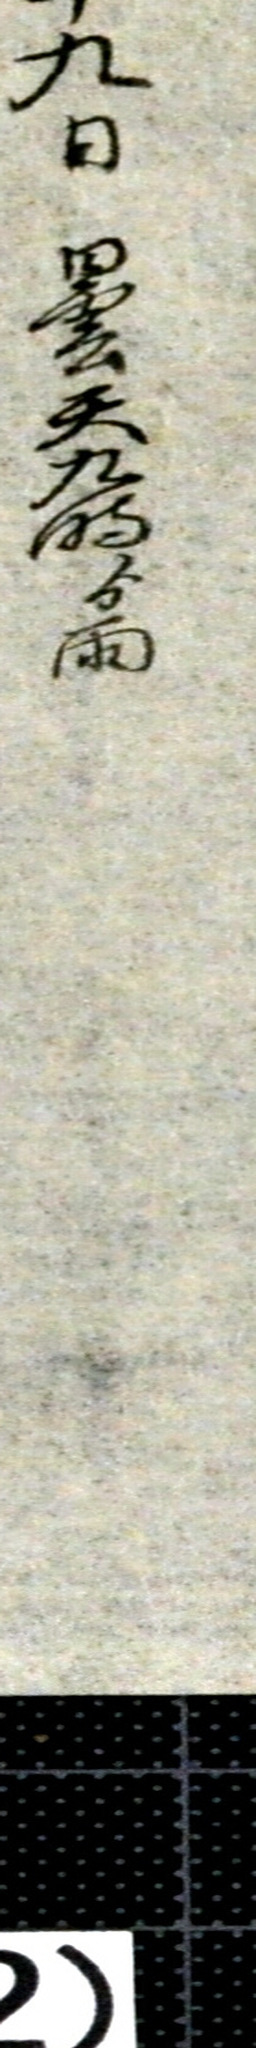十九日曇天九時ゟ雨
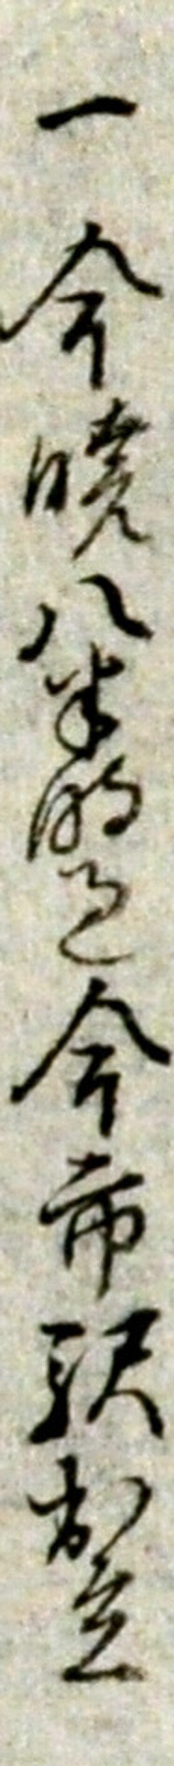一今暁八半時過今市駅出立
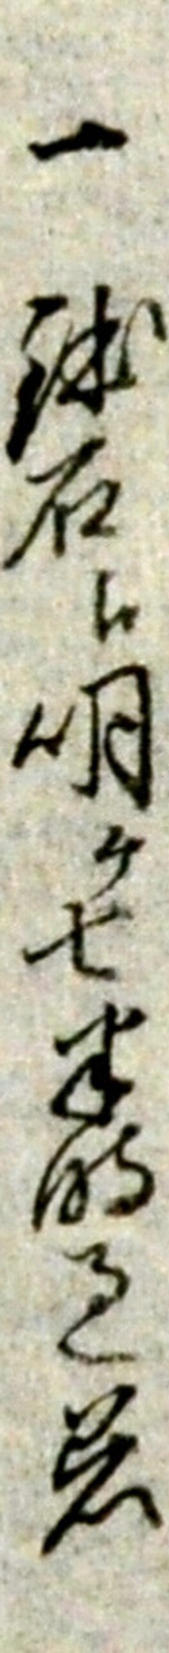一鉢石江明ケ七半時過着
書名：日光御名代相勤候節ノ留
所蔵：伊那市立高遠町図書館・合同会社AMANE
